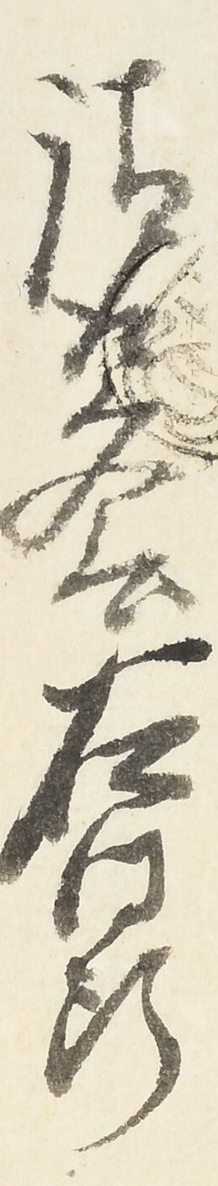請取文言右同断
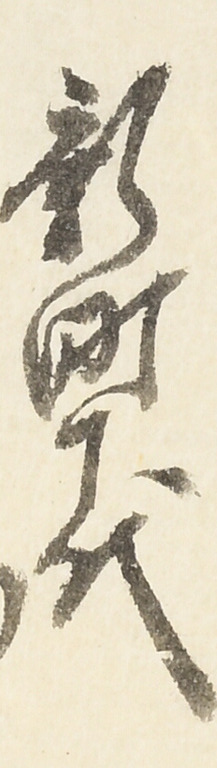新町丁代
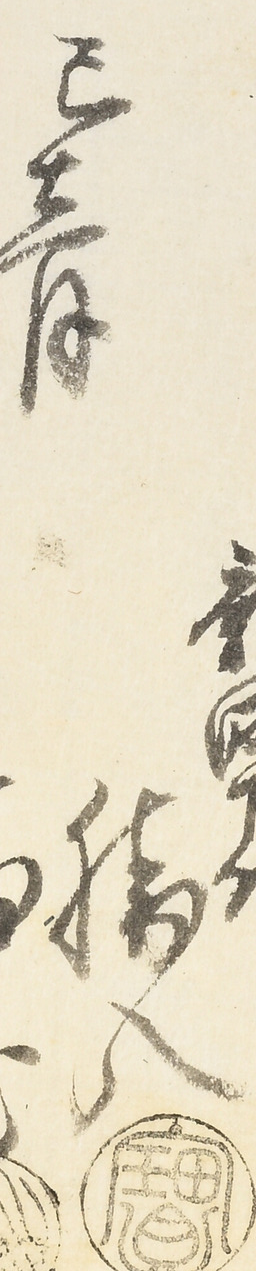巳十二月勝蔵
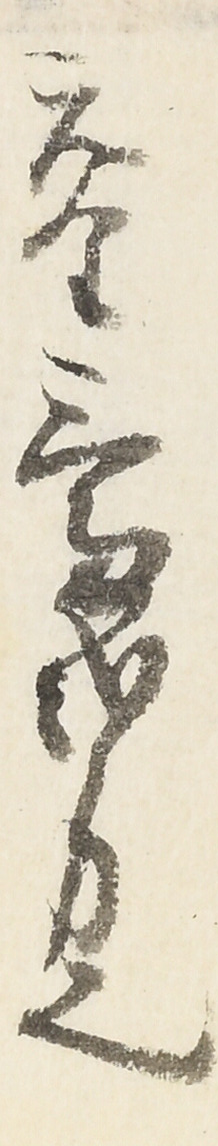元金三両弐分也
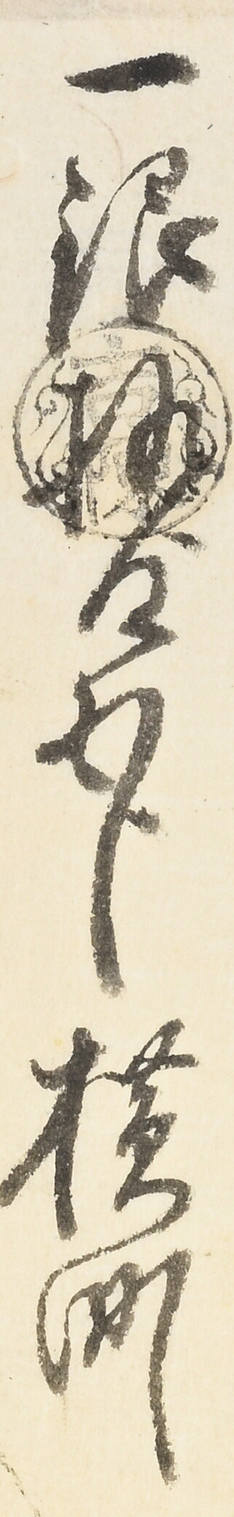一銀拾匁五分横町
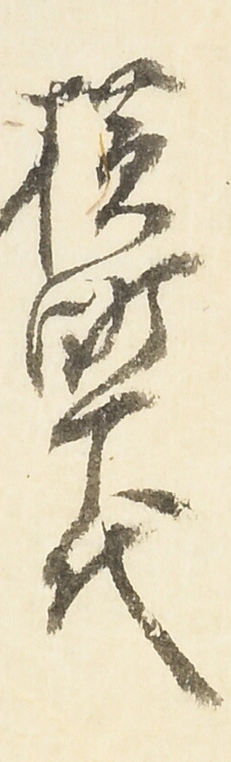横町丁代
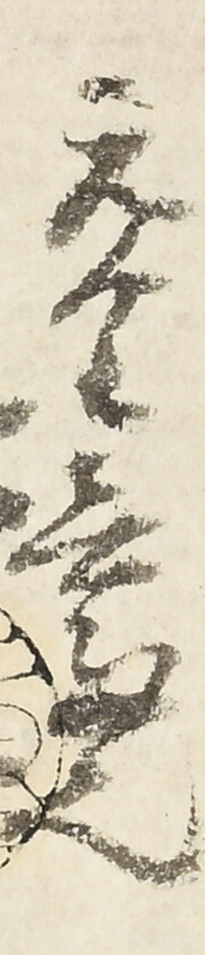元金壱両也
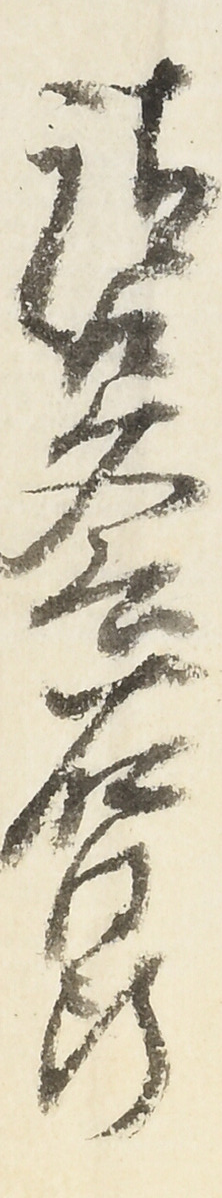請取文言右同断
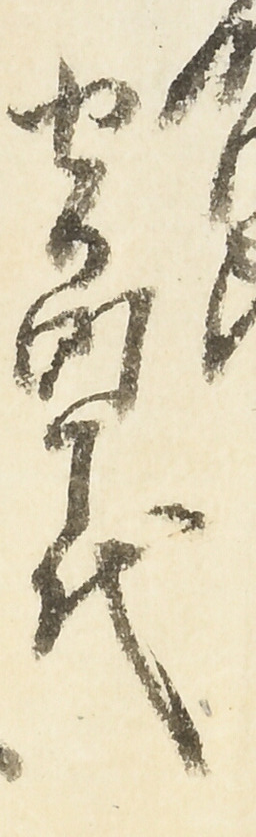せり町丁代
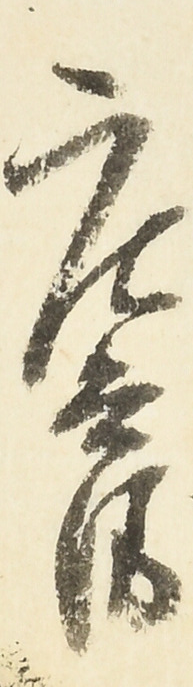庄兵衛

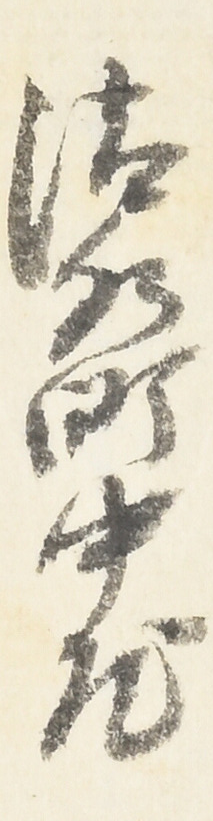清水町丁代
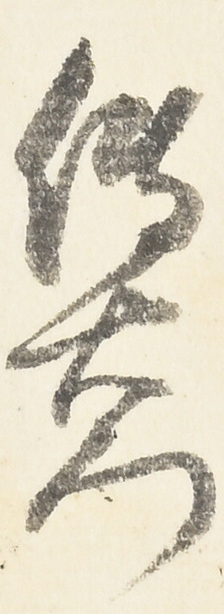伝右衛門
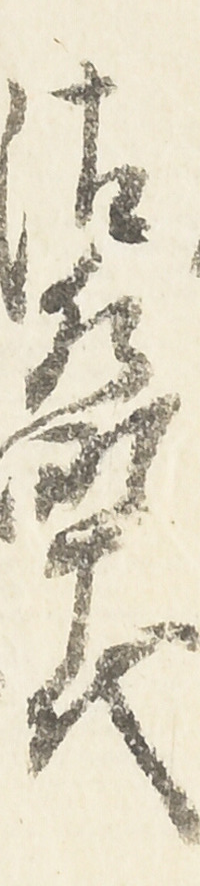清水町丁代
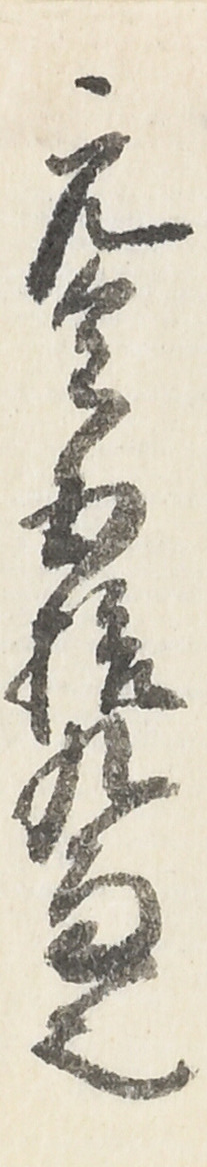元金五拾九両也
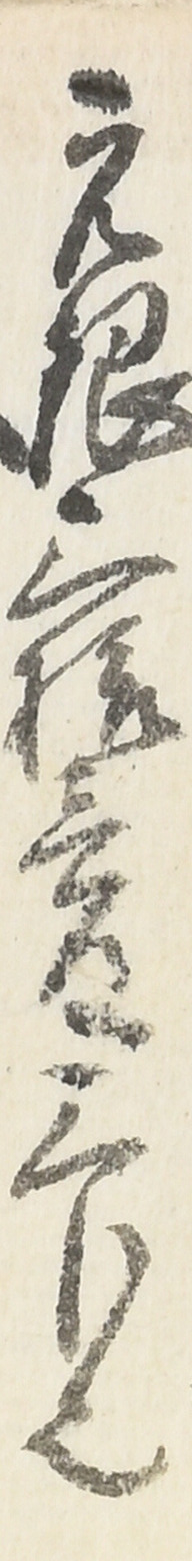元銀三拾壱匁三分也
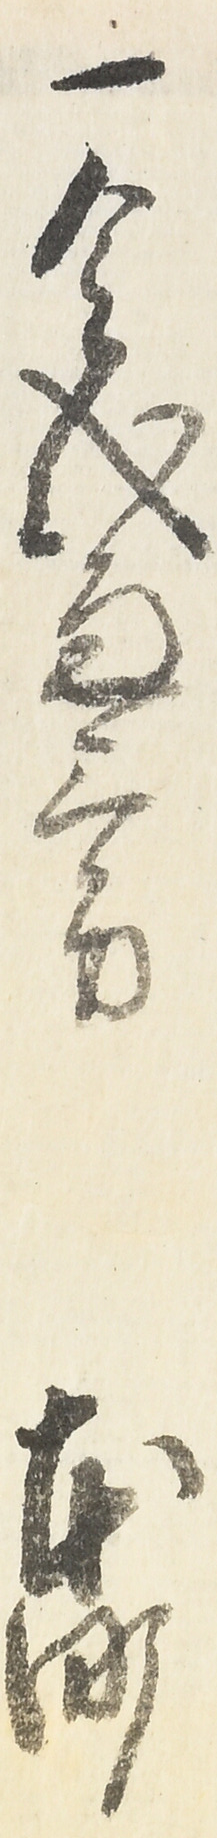一金弐両三分本町
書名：御才覚金御利足割渡扣帳
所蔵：伊那市立高遠町図書館・合同会社AMANE
